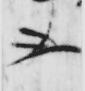之
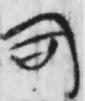司
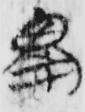愄（威）
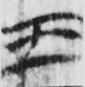王
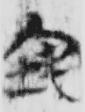○（坉）
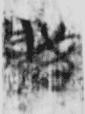戕
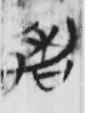嘉
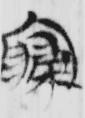寢
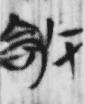○（令）
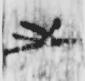之
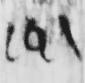州
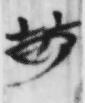苛
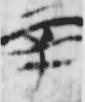辛
